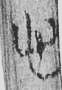心
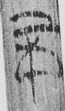不
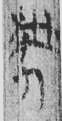○（勝）
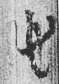心
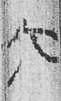大
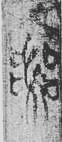○（亂）
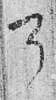乃
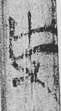拃（作）
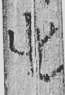心
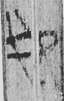女（如）
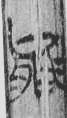能
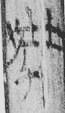○（勝）
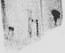心
